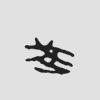武
